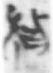紫
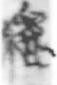○（紕）
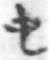屯
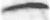一
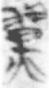翼
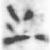之
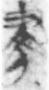○（畫）
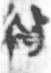紫
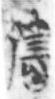○（席）
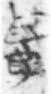○（緅）
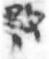敗
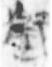○（衡）
